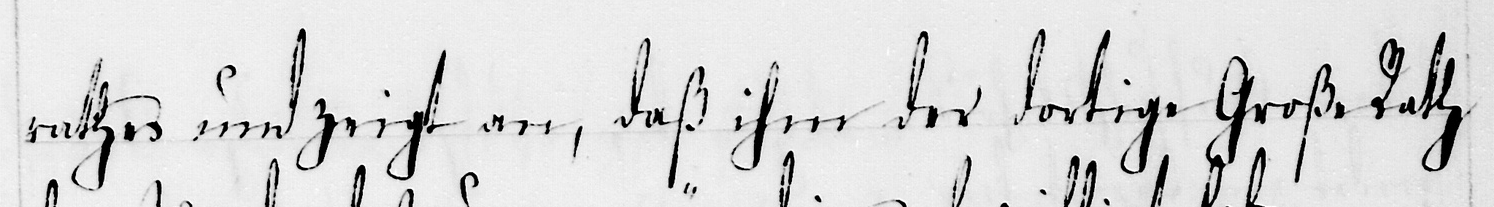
rathes und zeigt an, daß ihm der dortige Große Rath
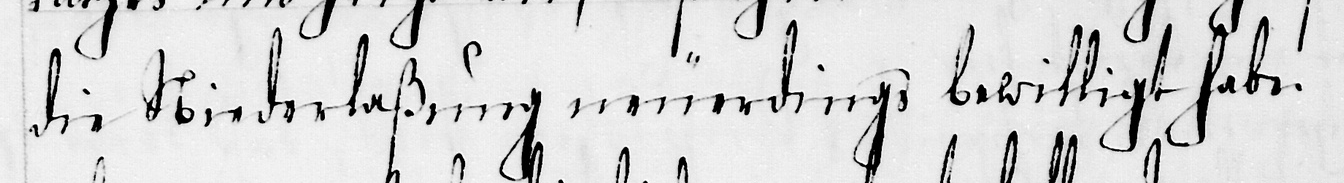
die Niederlaßung neuerdings bewilligt habe.
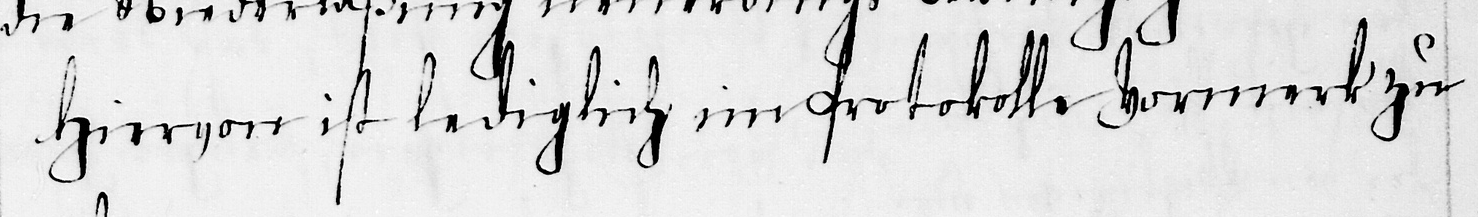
Hiervon ist lediglich im Protokolle Vermerk zu
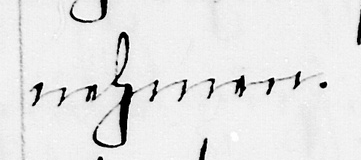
nehmen.
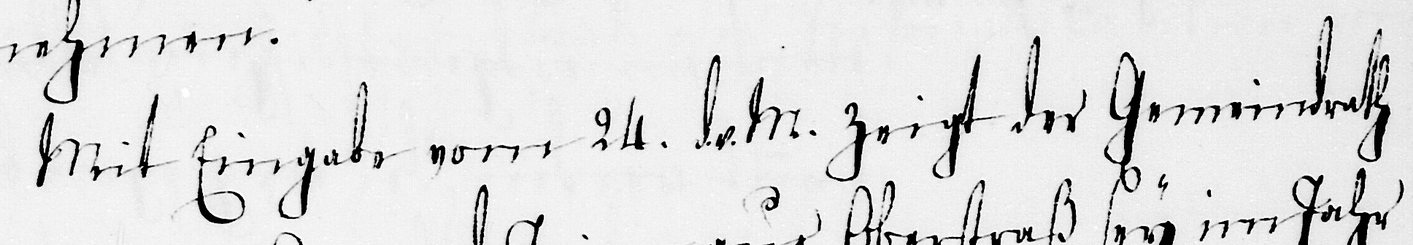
Mit Eingabe vom 24. d. v. M. zeigt der Gemeindrath
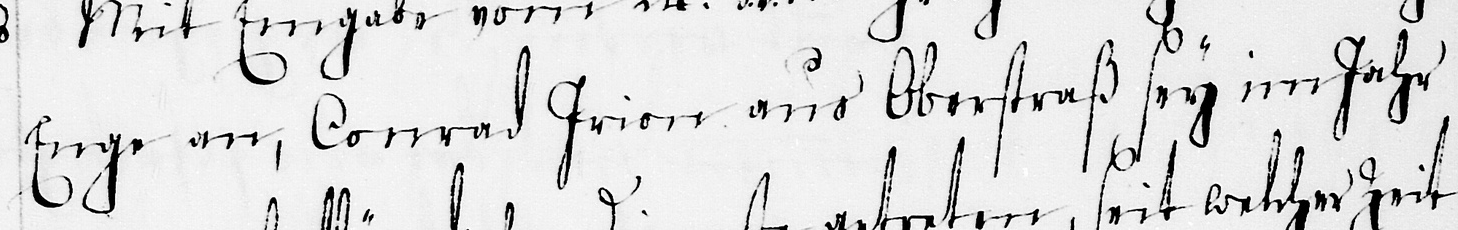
Enge an, Conrad Irion aus Oberstraß sey im Jahr
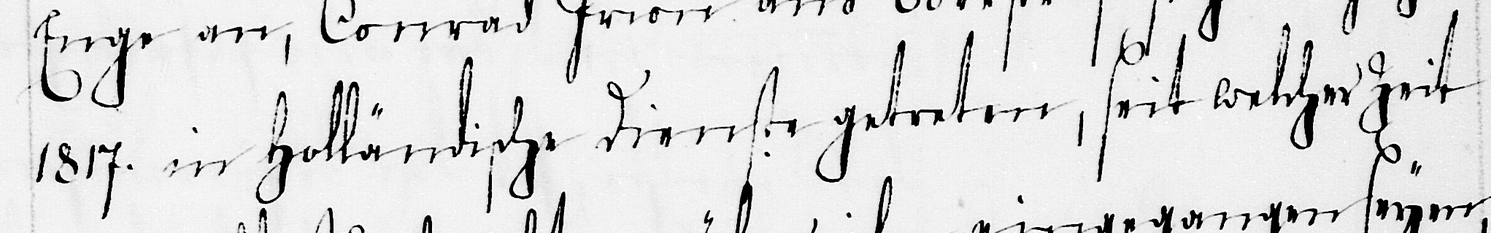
1817. in Holländische Dienste getreten, seit welcher Zeit
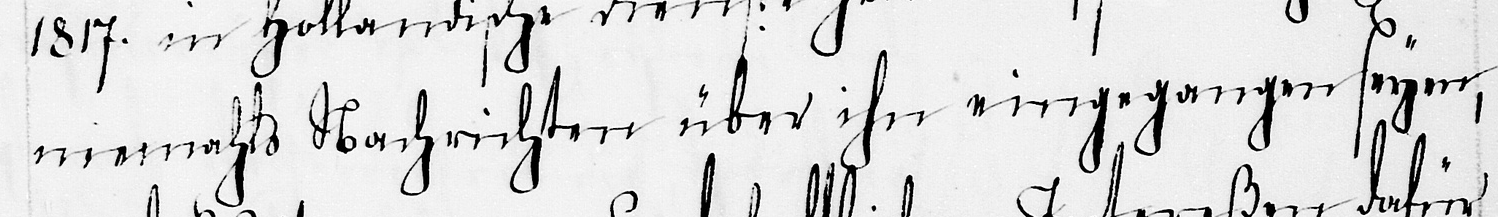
niemahls Nachrichten über ihn eingegangen seyen,
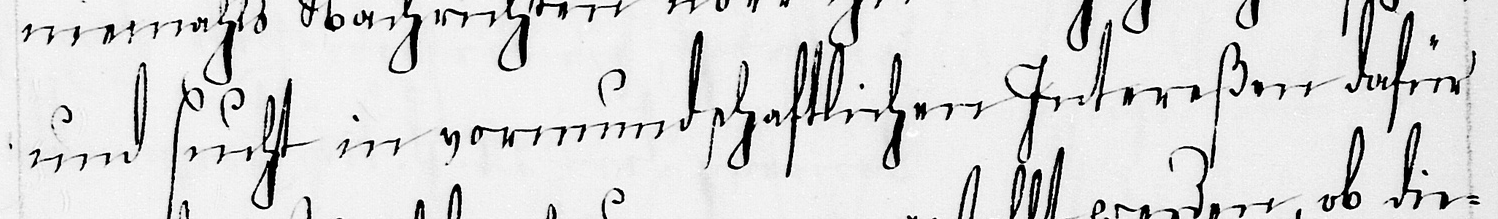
und sucht in vormundschaftlichen Intereßen dafür
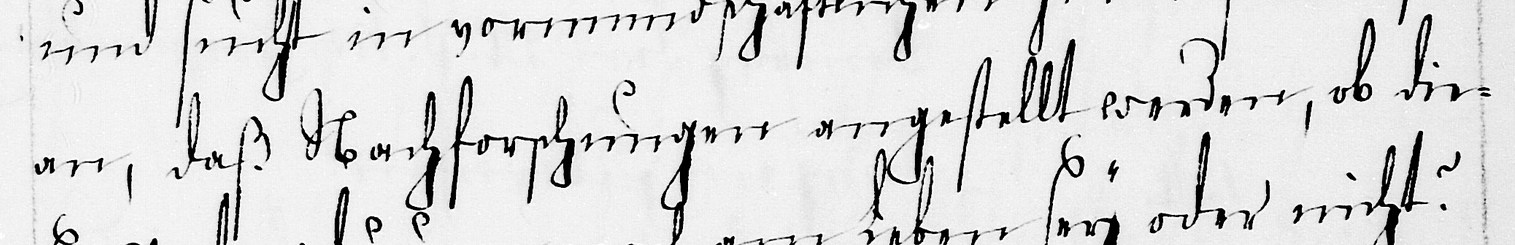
an, daß Nachforschungen angestellt werden, ob die¬
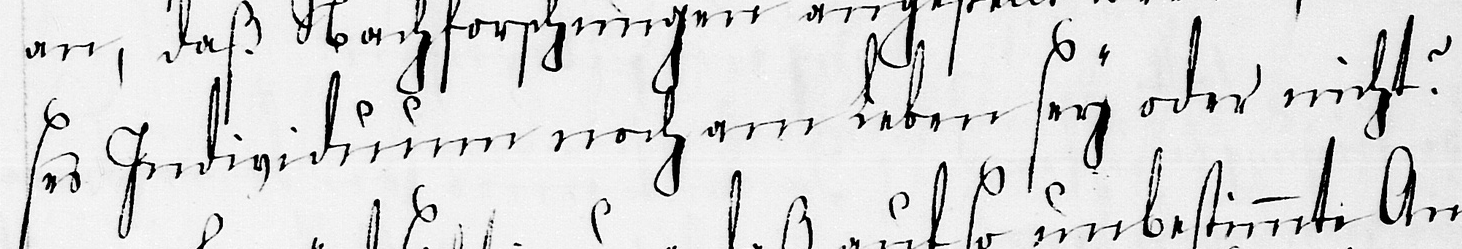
ses Individuum noch am Leben sey oder nicht?
